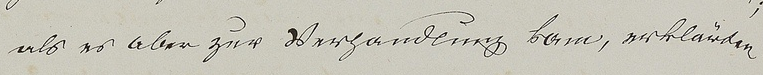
als es aber zur Verhandlung kam, erklärten
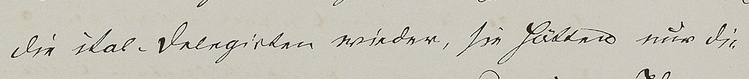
die ital. Delegirten wieder, sie hätten nur die
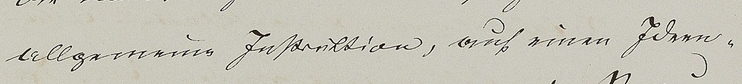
allgemeine Instruktion, auf einen Ideen-
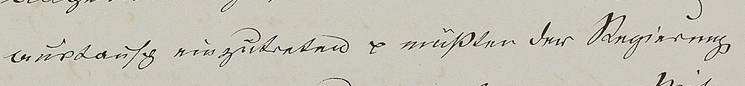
austausch einzutreten & müßten der Regierung
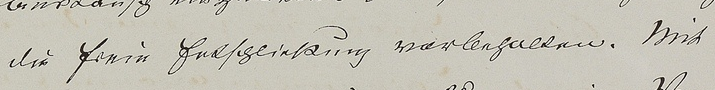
die freie Entschließung vorbehalten. Mit
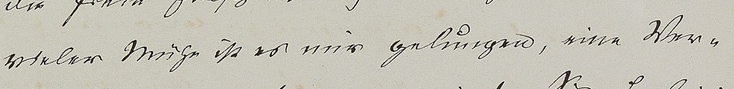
vieler Mühe ist es mir gelungen, eine Ver-
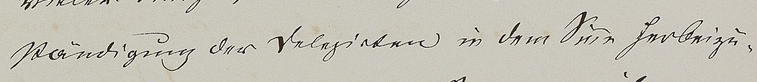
ständigung der Delegirten in dem Sinne herbeizu-
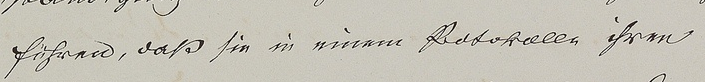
führen, daß sie in einem Protokolle ihren
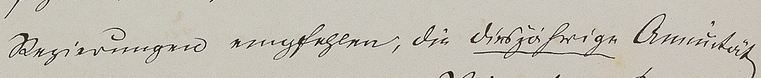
Regierungen empfehlen, die diesjährige Annuität
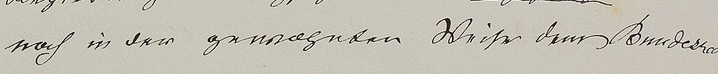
noch in der gewohnten Weise dem Bundesrathe
